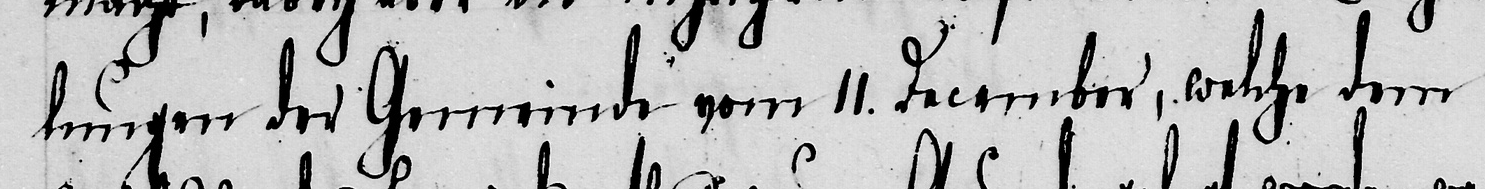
dlungen der Gemeinde vom 11. December, welche dem
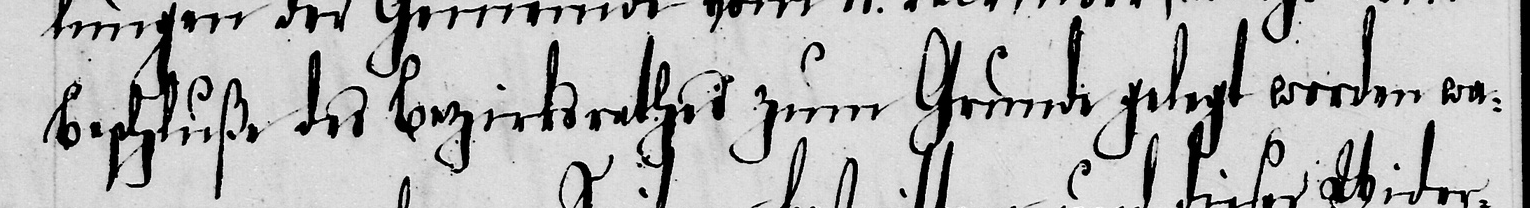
Beschluße des Bezirksrathes zum Grunde gelegt worden wa¬
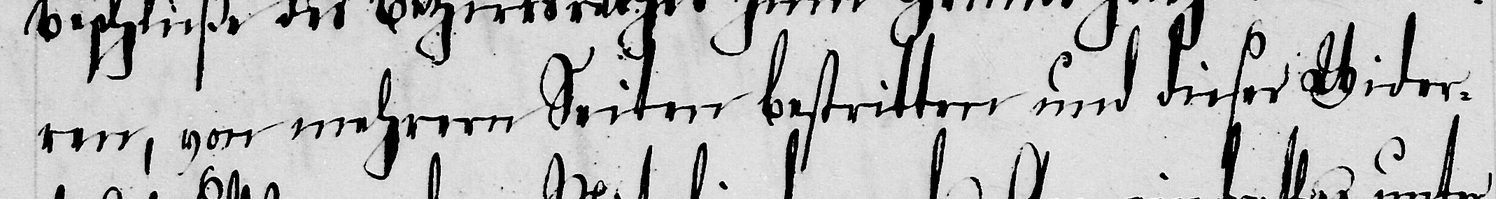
ren, von mehrern Seiten bestritten und dieser Widers¬
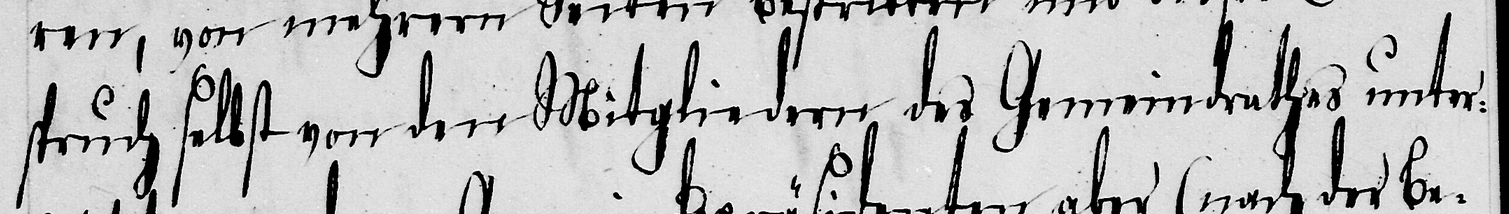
pruch selbst von den Mitgliedern des Gemeindrathes unter¬
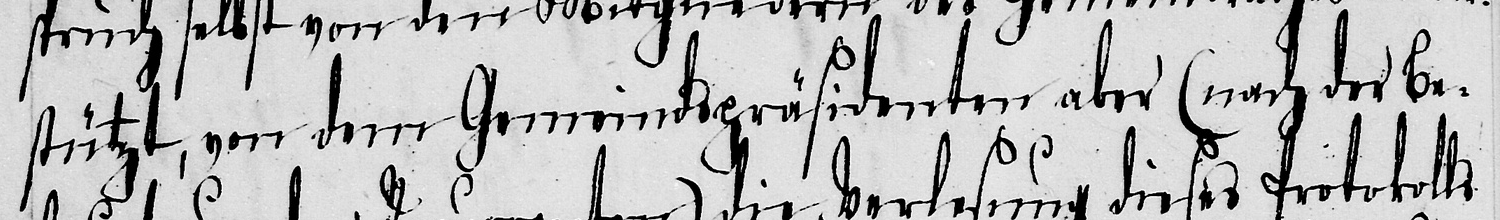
stützt, von dem Gemeindspräsidenten aber (nach der Be¬
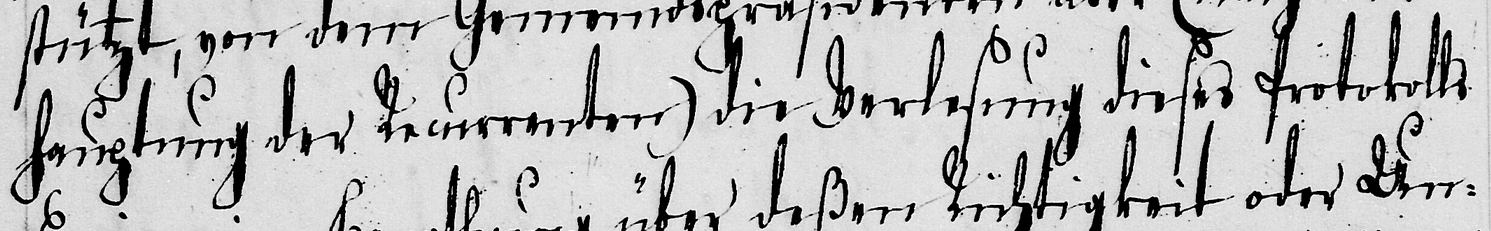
hauptung der Recurrenten) die Verlesung dieses Protokolls
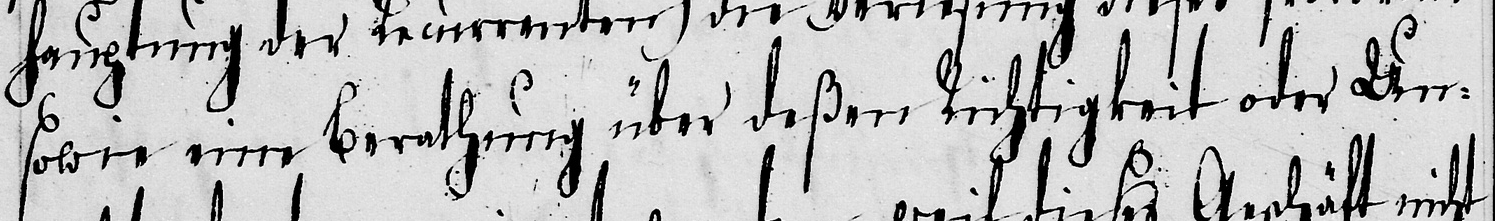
sowie eine Berathung über deßen Richtigkeit oder Un¬
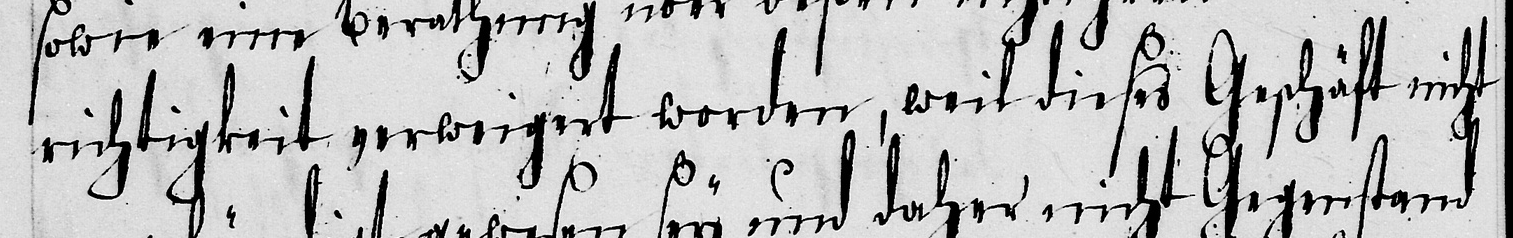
richtigkeit verweigert worden, weil dieses Geschäft nicht
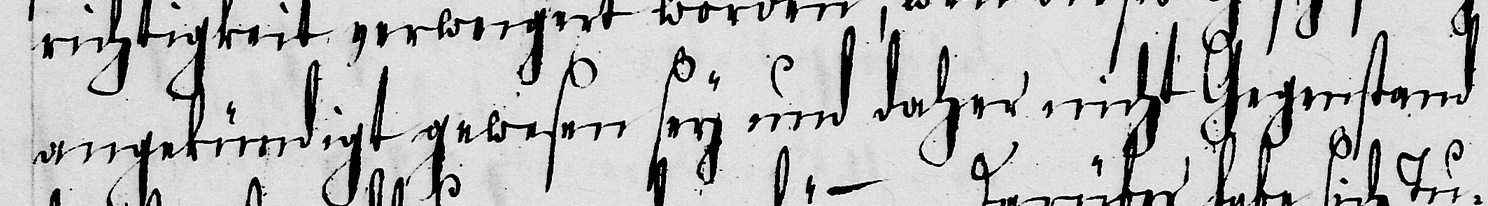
angekündigt gewesen sey und daher nicht Gegenstand
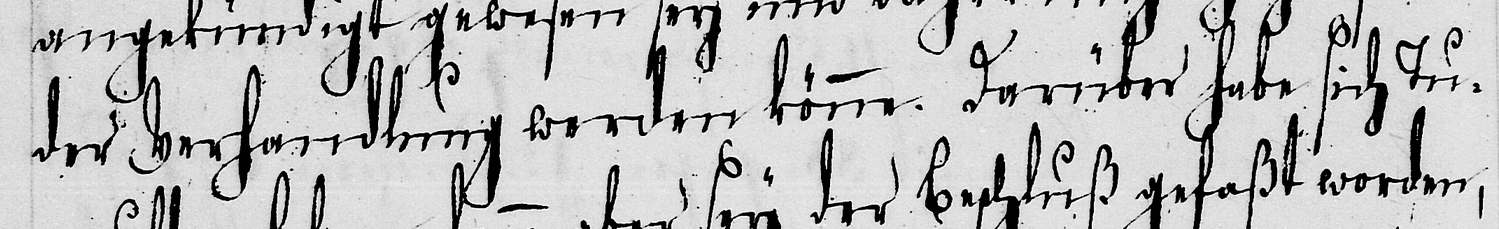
der Verhandlung werden könne. Darüber habe sich Tu¬
